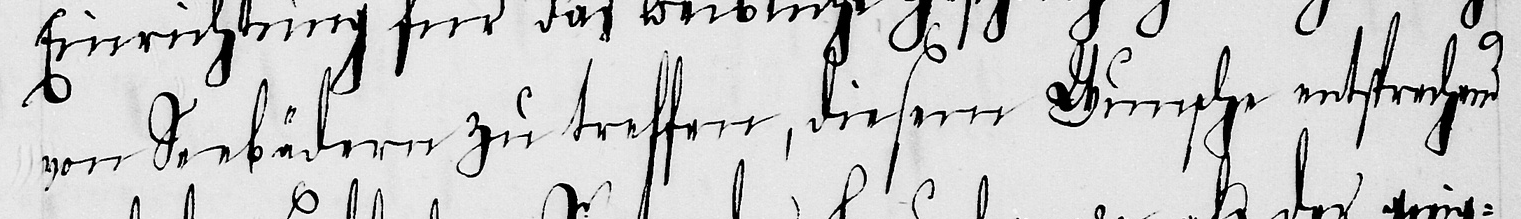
von Seebädern zu treffen, diesem Wunsche entspreche¬
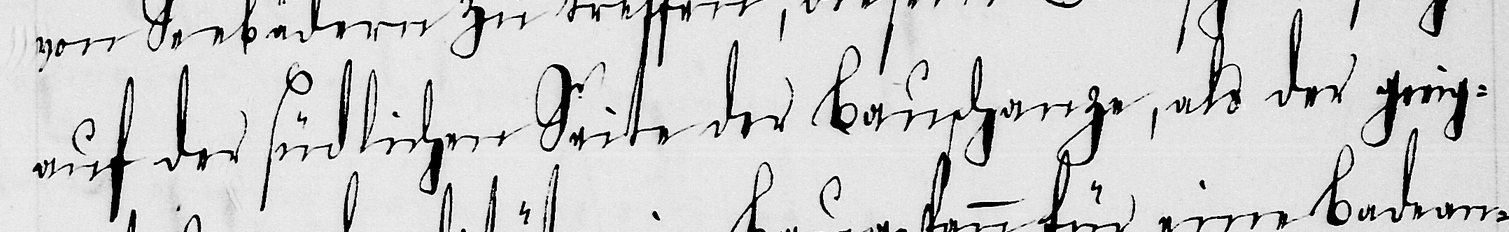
auf der südlichen Seite der Bauschanze, als der geei¬
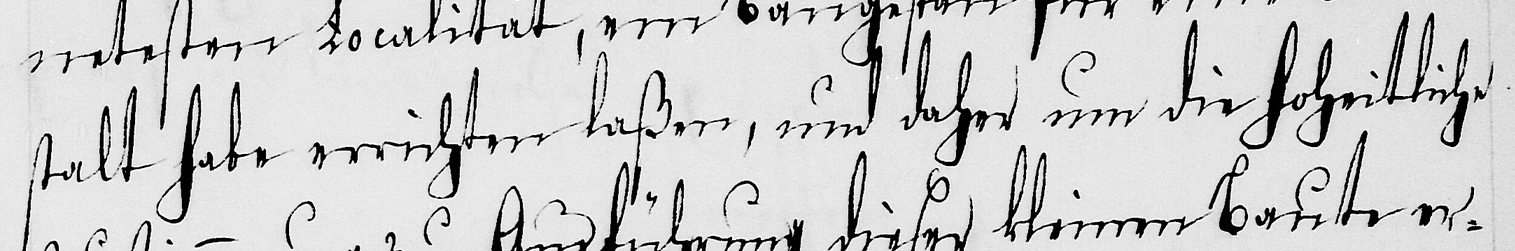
talt habe errichten laßen, und daher um die hoheitliche
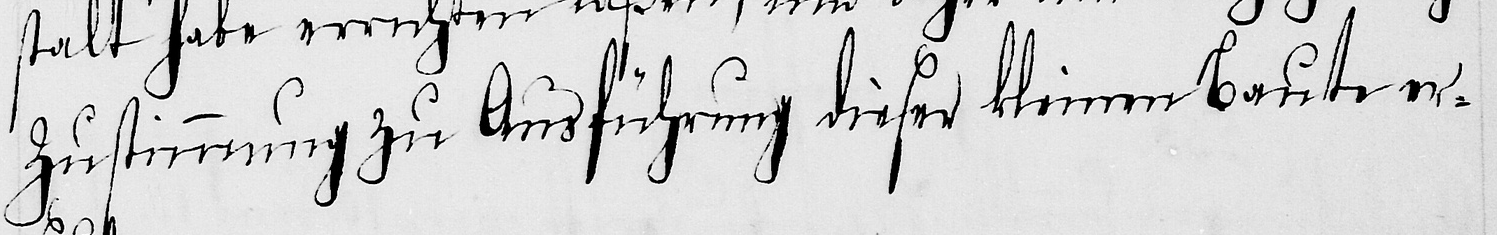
Zustimmung zu Ausführung dieser kleinen Baute er¬
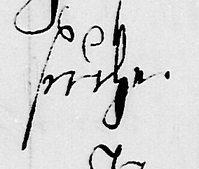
suche.
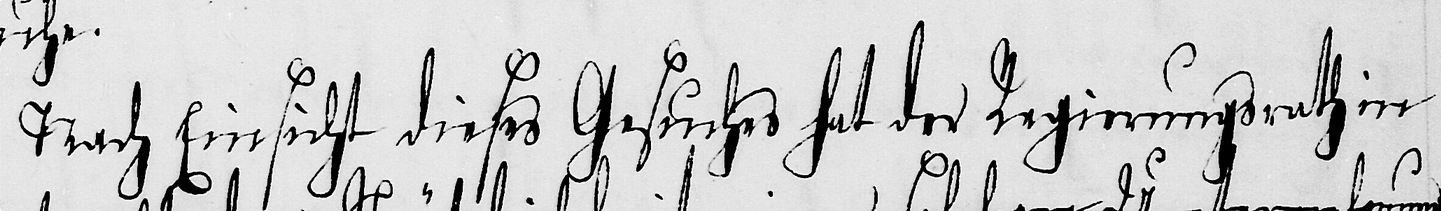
Nach Einsicht dieses Gesuches hat der Regierungsrath in
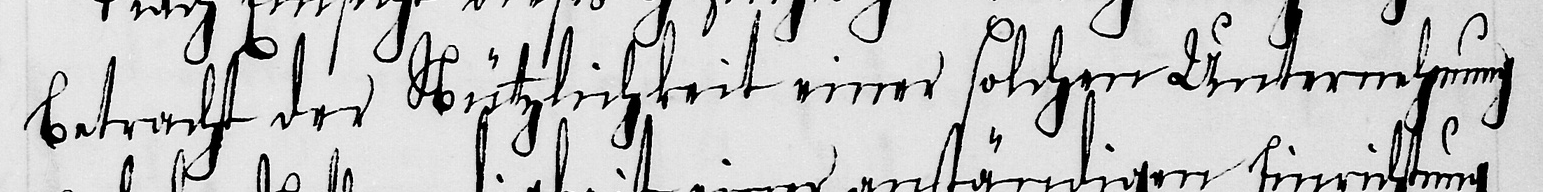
Betracht der Nützlichkeit einer solchen Unternehmung
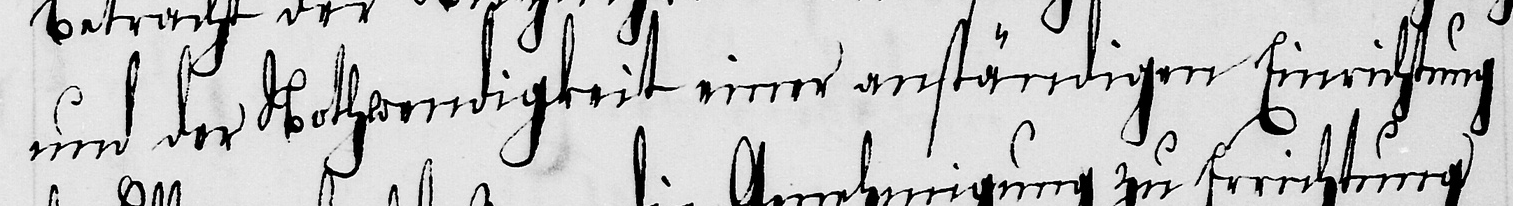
und der Nothwendigkeit einer anständigen Einrichtung
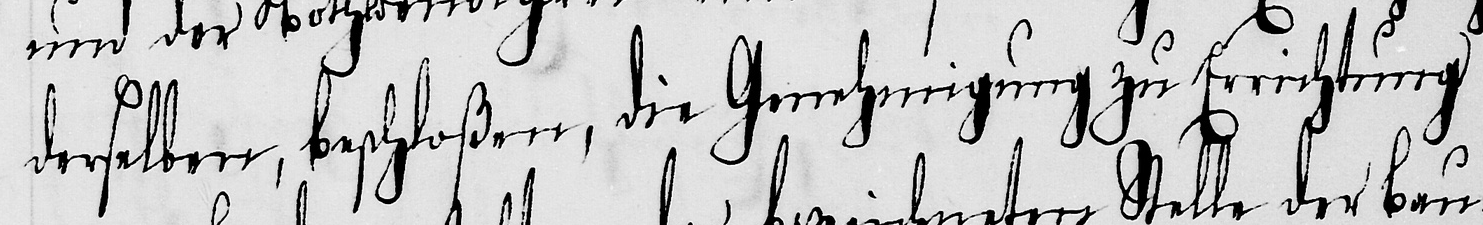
derselben, beschloßen, die Genehmigung zu Errichtung
